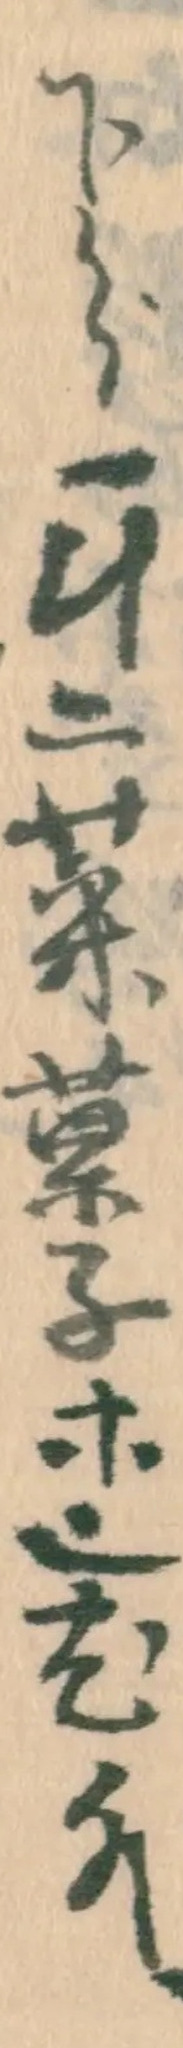下分一汁二菜菓子等也尤外ニ
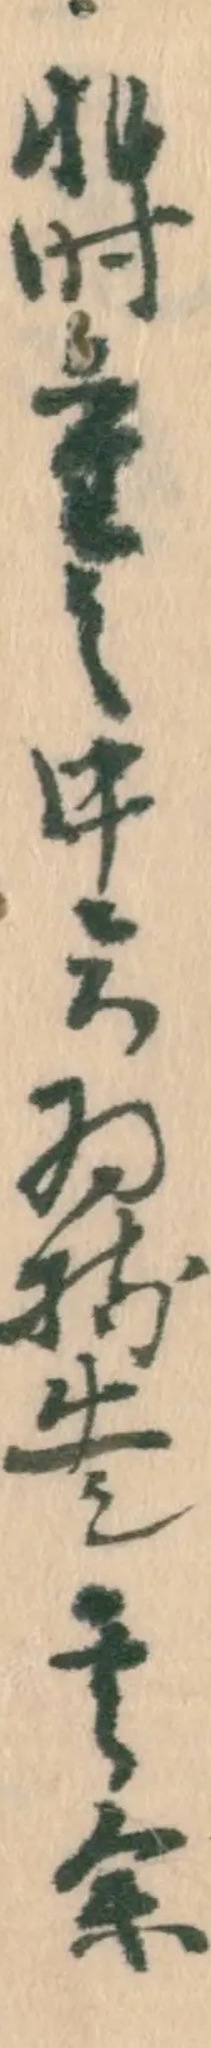非時重之中ニ而為持出シ其余
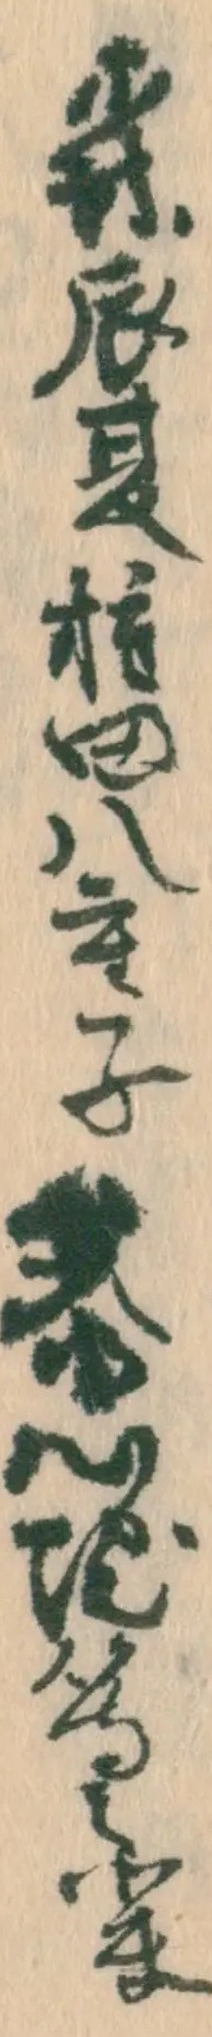森辰夏種田八重子泰心院等之輩
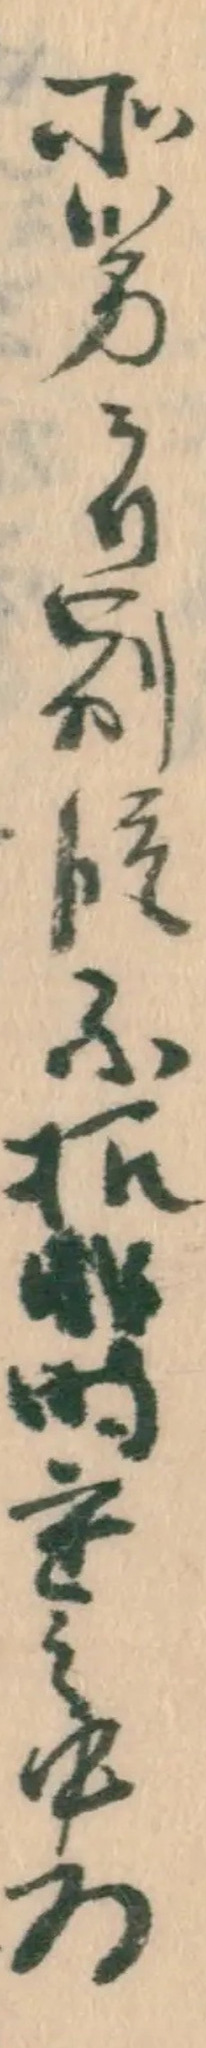所労ニ付別段不招非時重之中為
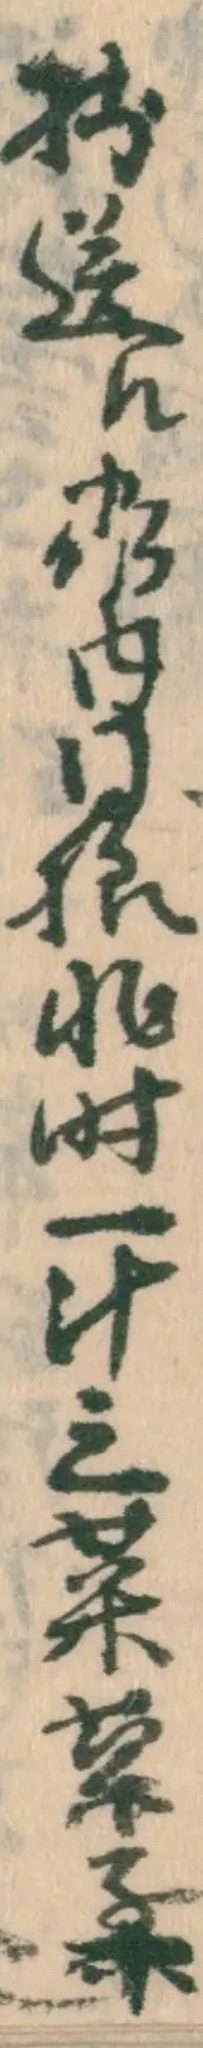持送ル家内同様非時一汁三菜菓子等也
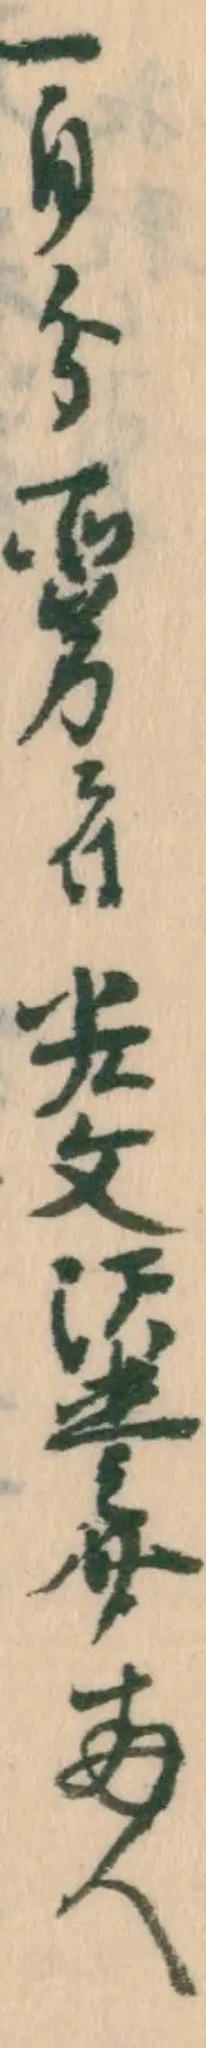一自分所労ニ付光文沢直之介両人
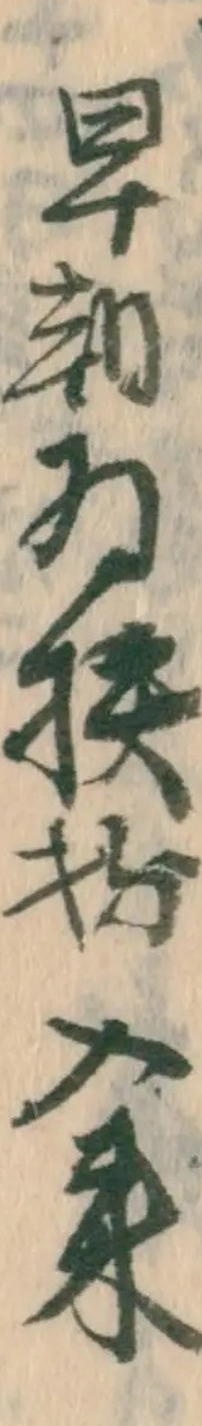早朝為扶持入来
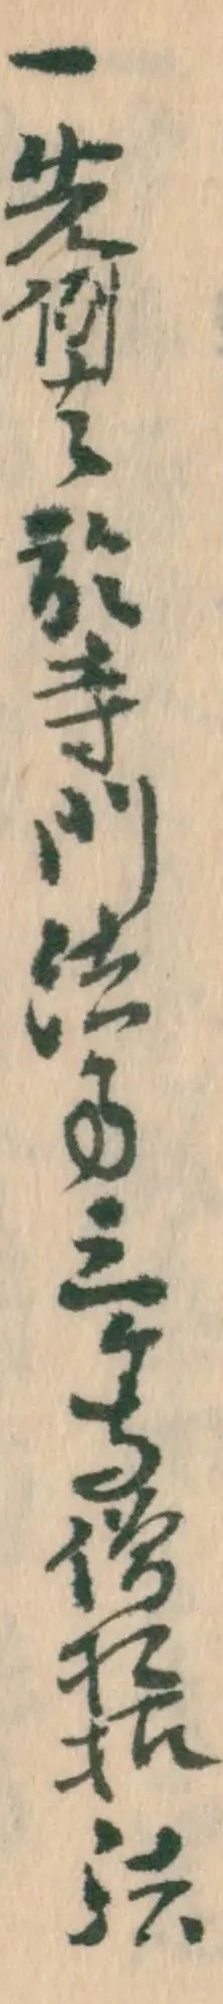一先例は於寺門法事三ケ寺僧相招法
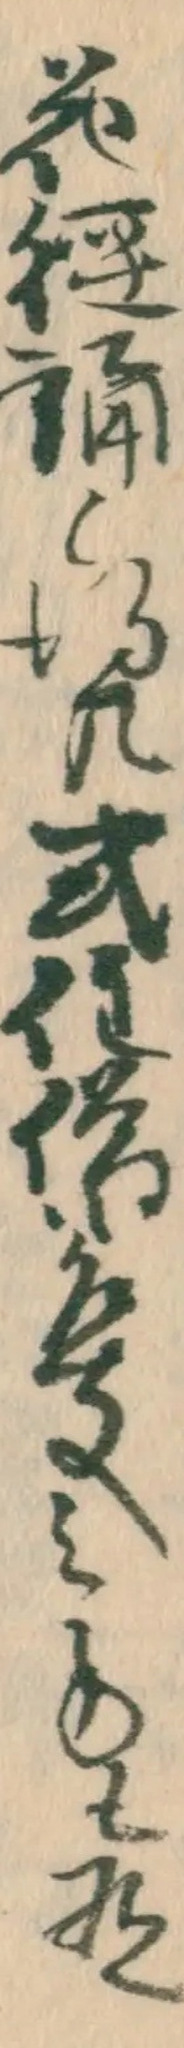花経誦候得共或住僧差支之方も有
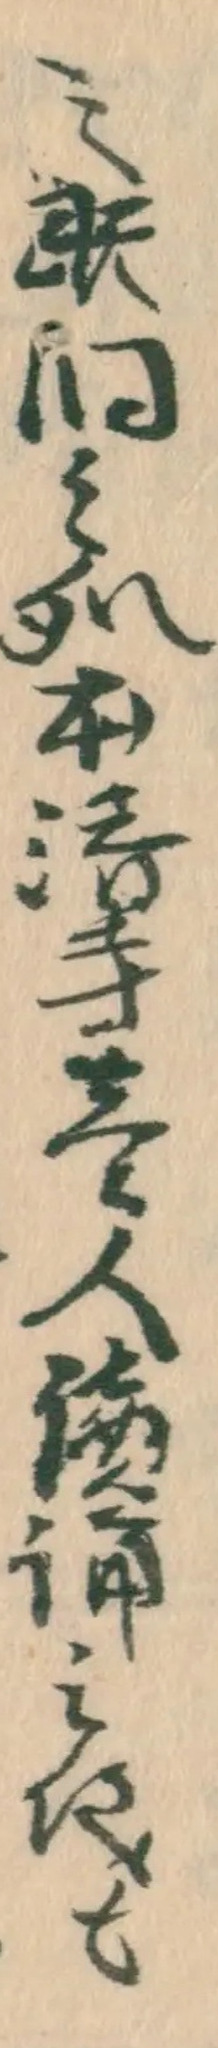之既洞之処本清寺壱人読誦之儀も
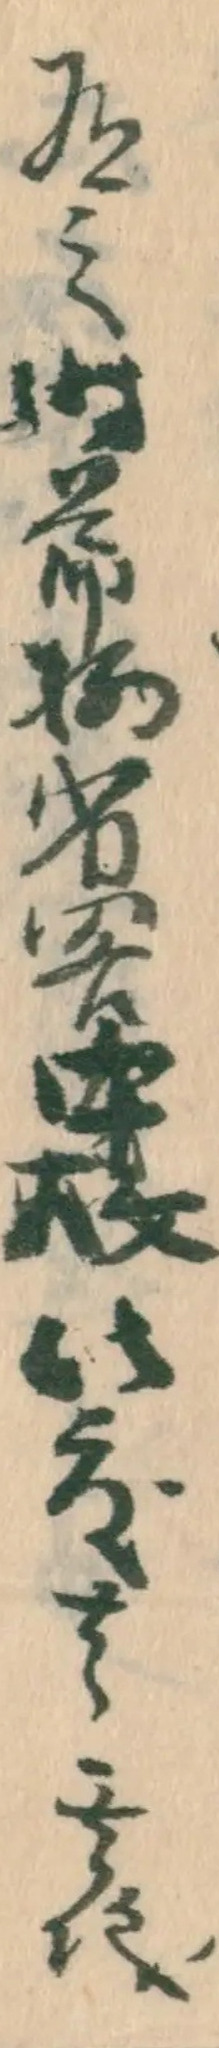有之時節柄省略中故此度は其儀
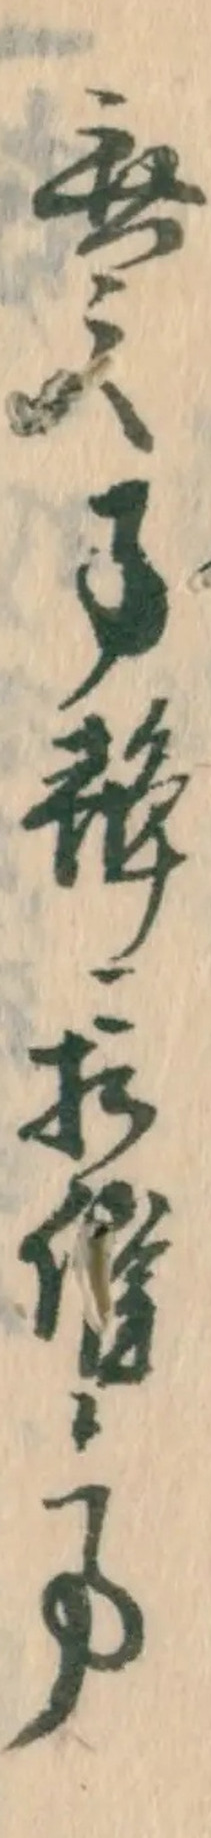無之事静ニ相催候事
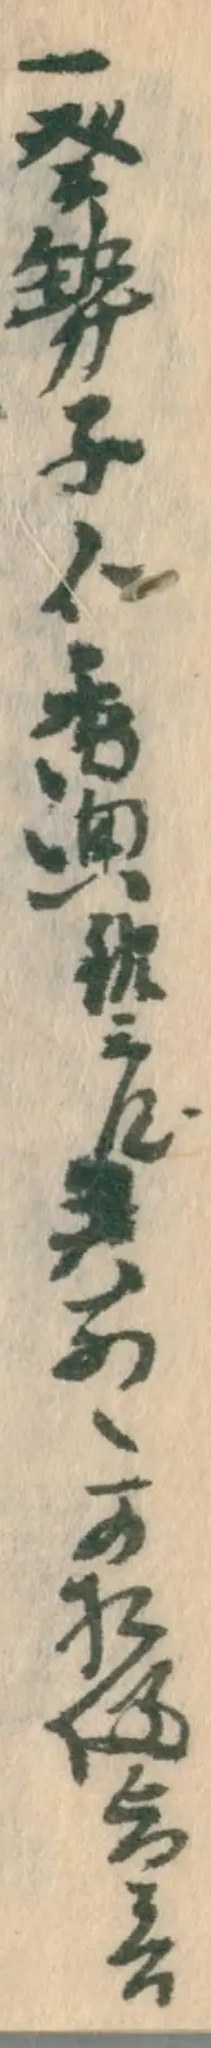一癸勢子ゟ香典銀三匁霊前へ可相備旨ニ而

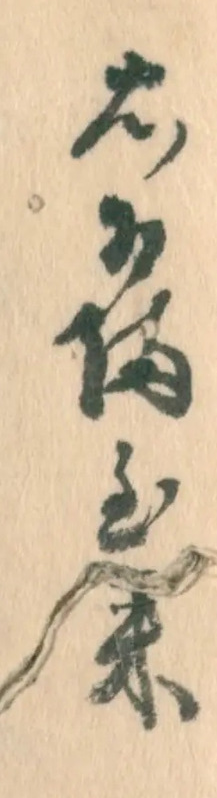右為備到来
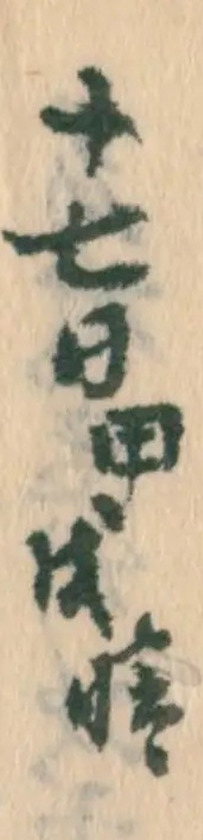十七日甲戌晴
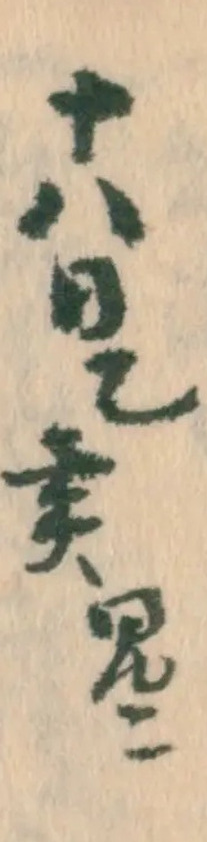十八日乙亥曇
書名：禁裏御所御用日記. [131]
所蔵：国立国会図書館 National Diet Library, JAPAN
